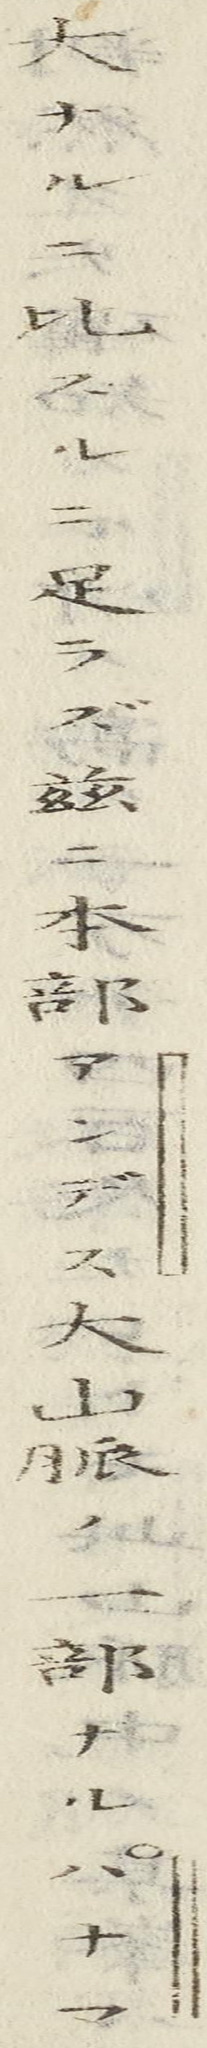大ナルニ比スルニ足ラズ爰ニ本部アンデス大山脈ノ一部ナルパナマ
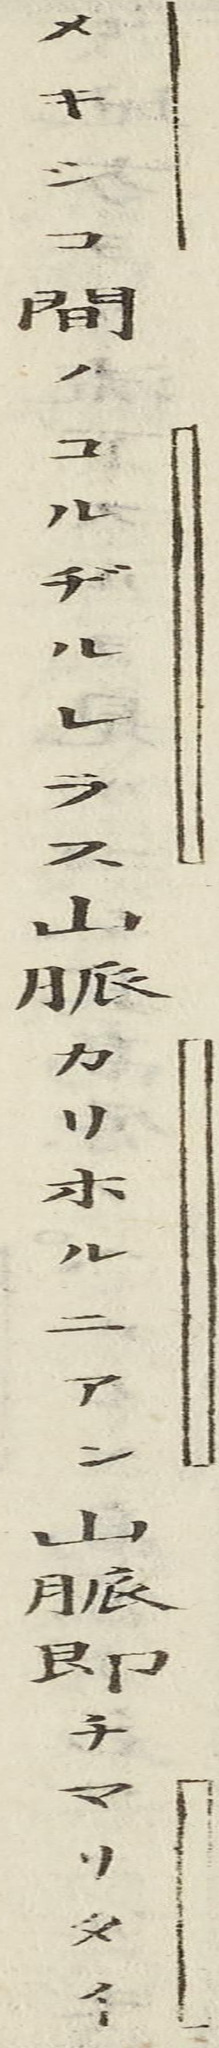メキシコ間ノコルヂルレラス山脈カリホルニアン山脈即チマリタイ
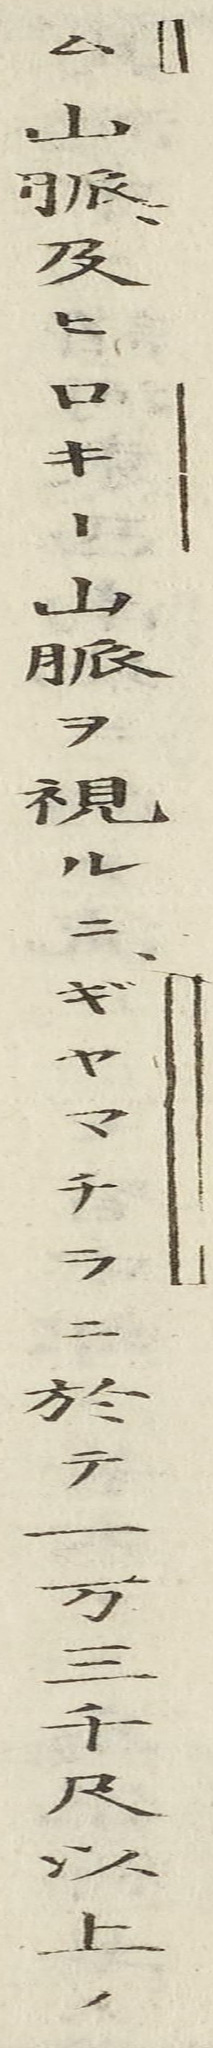ム山脈、及ヒロキー山脈ヲ視ルニ、ギヤマチラニ於テ一万三千尺以上ノ
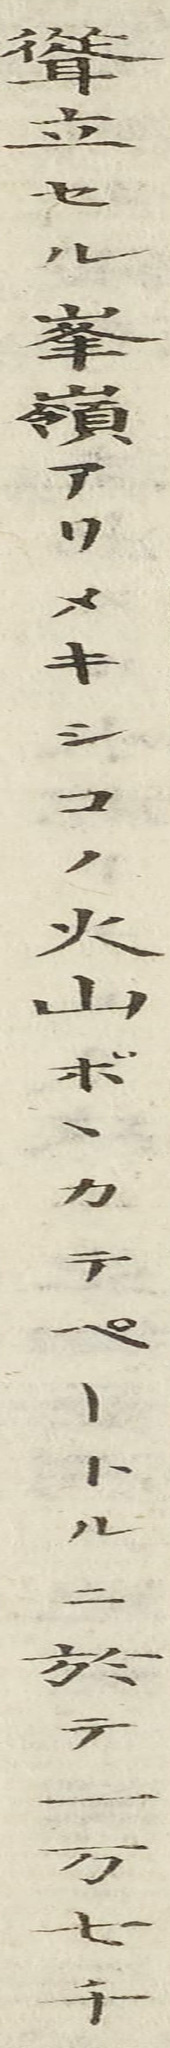聳立セル峯嶺アリメキシコノ火山ボヽカテペートルニ於テ一万七千
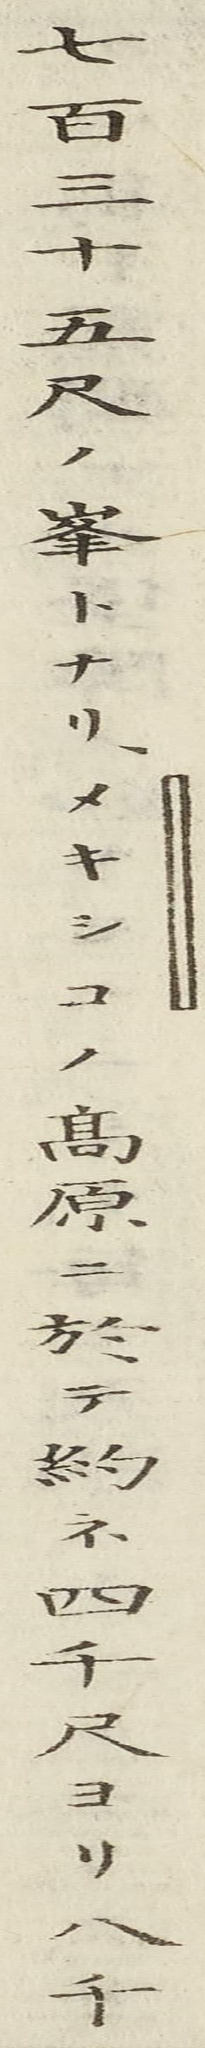七百三十五尺ノ峯トナリ、メキシコノ高原ニ於テ約ネ四千尺ヨリ八千
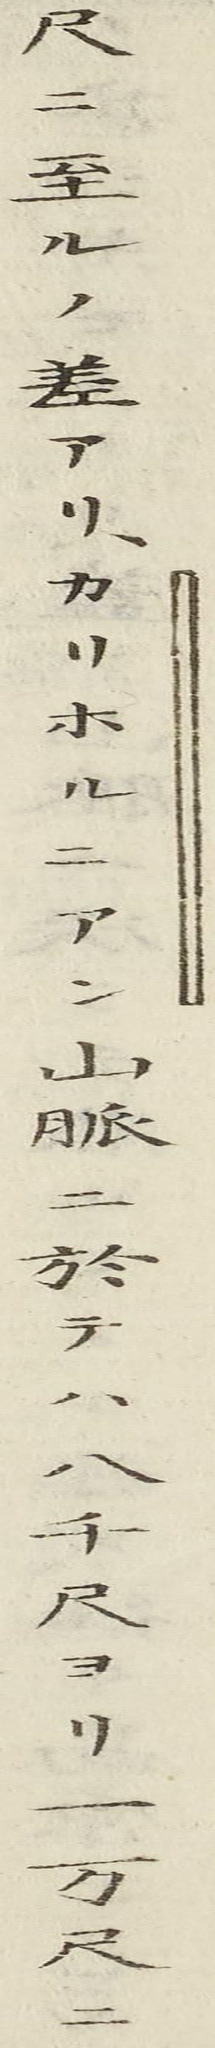尺ニ至ルニ差アリ、カリホルニアン山脈ニ於テハ八千尺ヨリ一万尺ニ
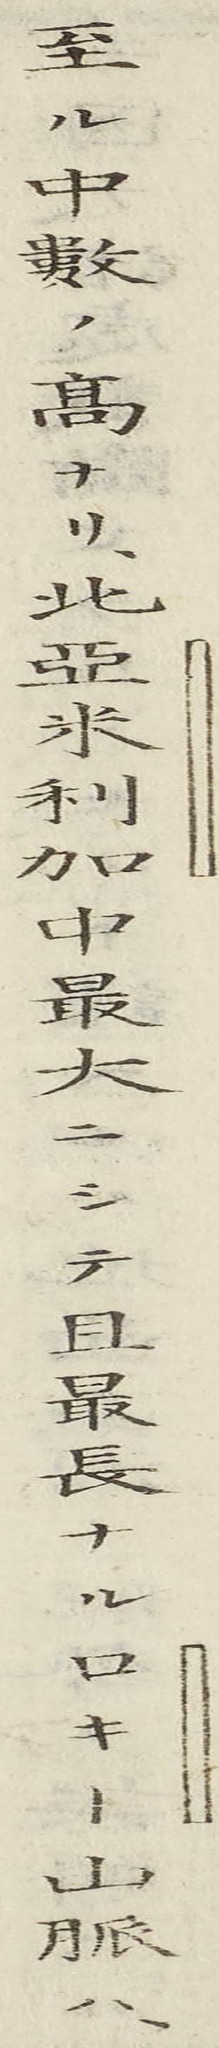至ル中数ノ高ナリ、北亜米利加中最大ニシテ且最長ナルロキー山脈ハ、
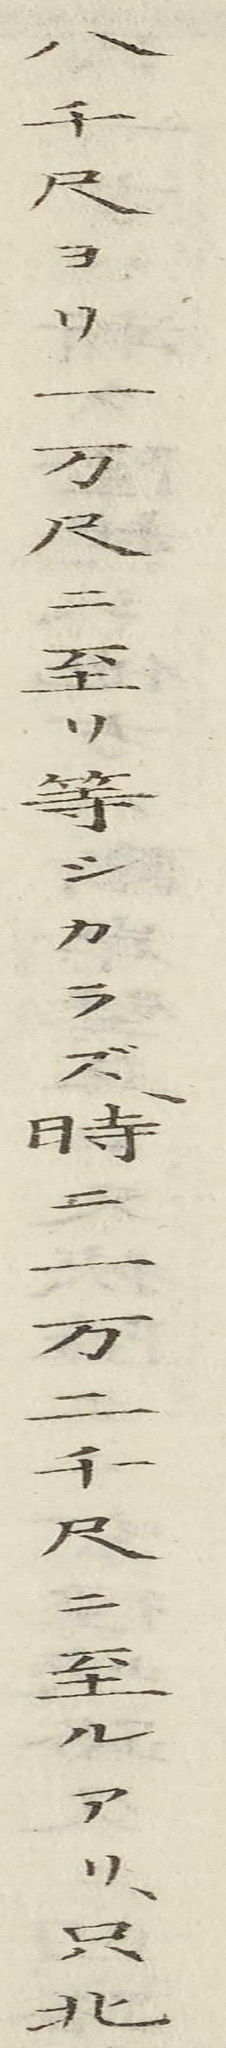八千尺ヨリ一万尺ニ至リ等シカラズ、時ニ一万二千尺ニ至ルアリ、只北
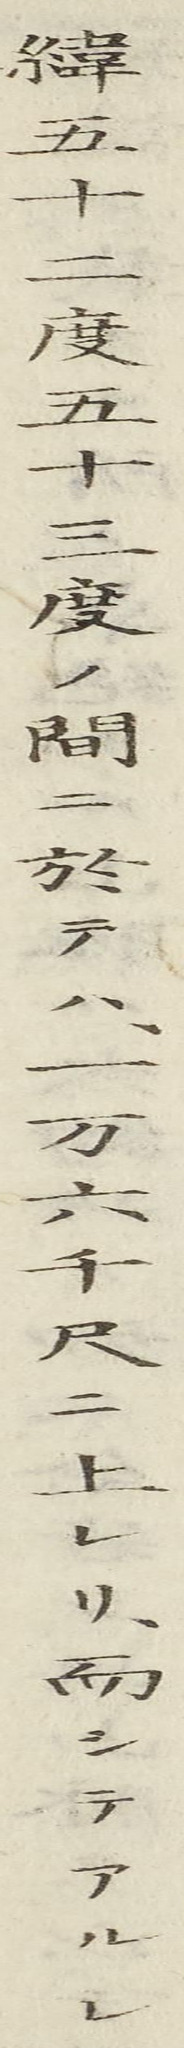緯五十二度五十三度ノ間ニ於テハ、一万六千尺ニ上レリ、而シテアルレ
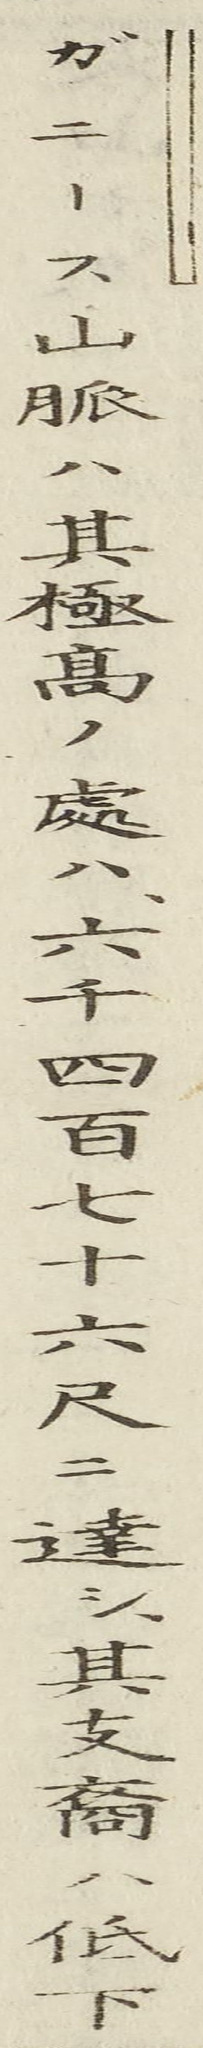ガニース山脈ハ其極高ノ処ハ、六千四百七十六尺ニ達シ、其支裔ハ低下
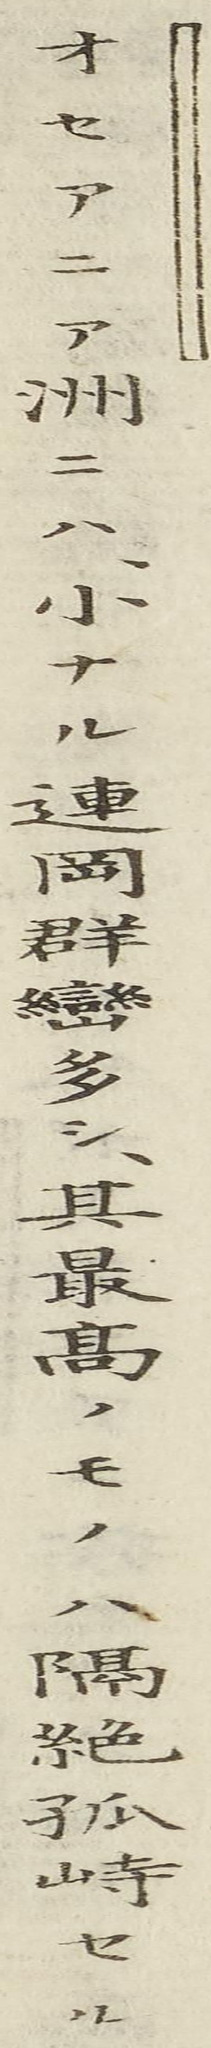オセアニア洲ニハ、小ナル連岡群巒多シ、其最高ノモノハ隔絶孤峙セル
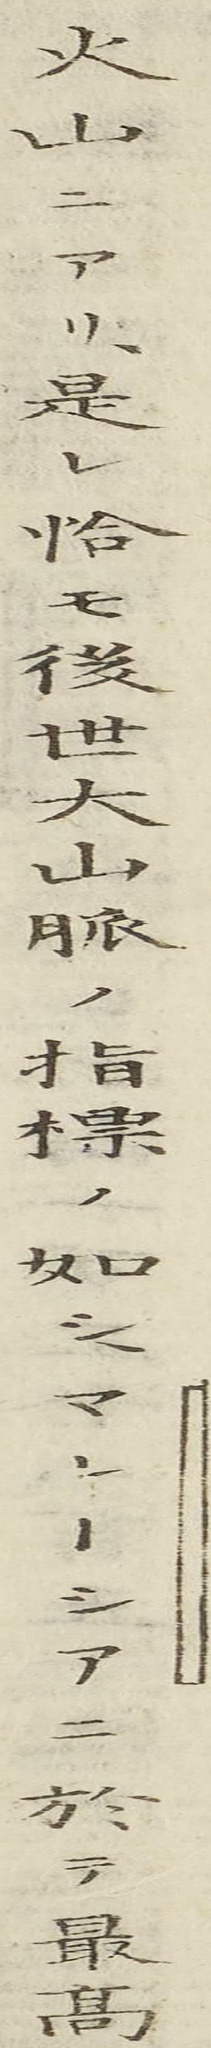火山ニアリ、是レ恰モ後世大山脈ノ指標ノ如シ、マレーシアニ於テ最高

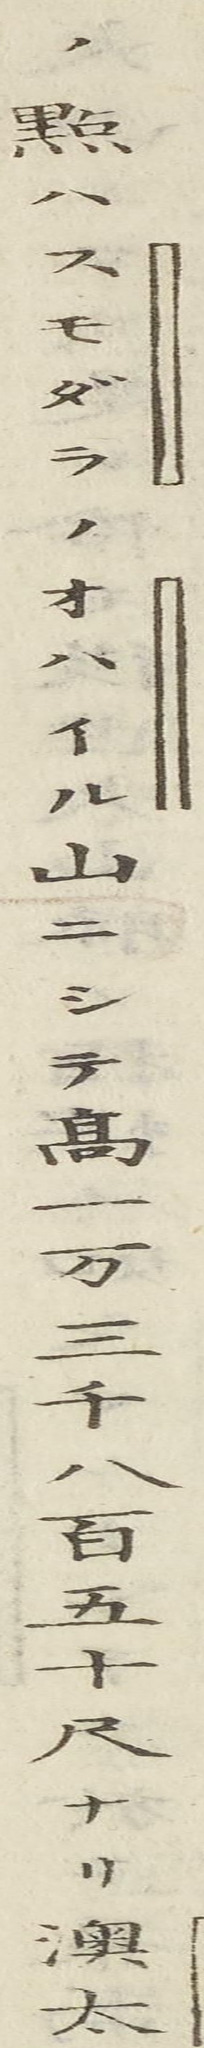ノ点ハスモダラノオハイル山ニシテ高一万三千八百五十尺ナリ澳太
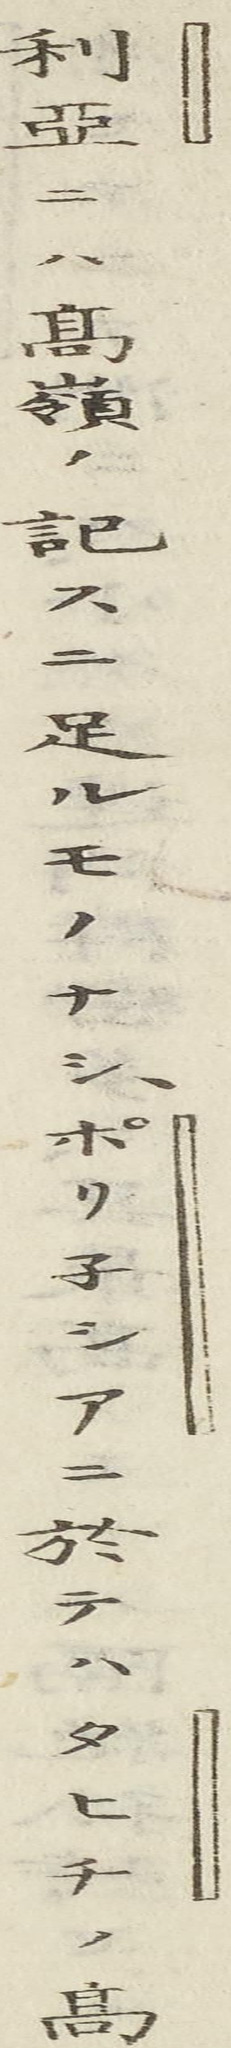利亜ニハ高嶺ノ記スニ足ルモノナシ、ポリネシアニ於テハタヒチノ高
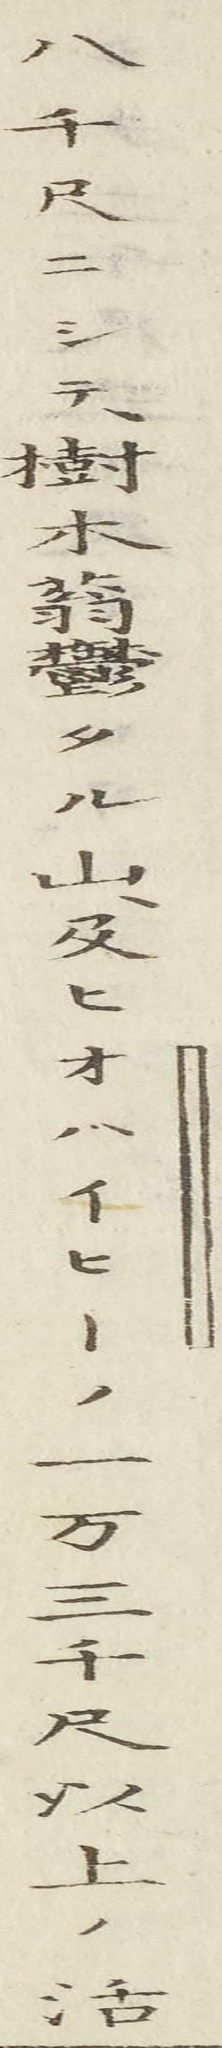八千尺ニシテ、樹木蓊鬱タル山、及ヒオハイヒーノ一万三千尺以上ノ活
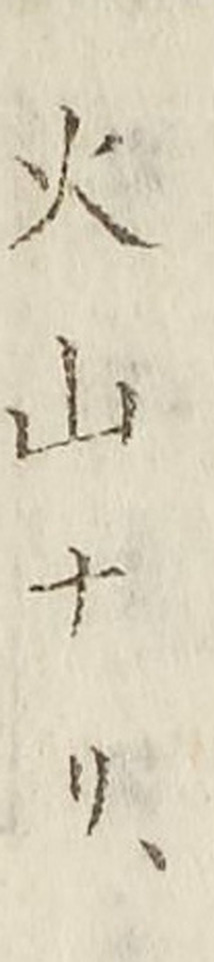火山ナリ、
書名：百科全書　地文學　全
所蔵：東京大学地震研究所図書室 Earthquake Research Institute Library, The University of Tokyo, JAPAN
